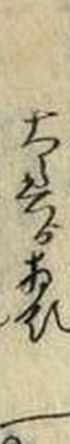大奥ゟ拝領

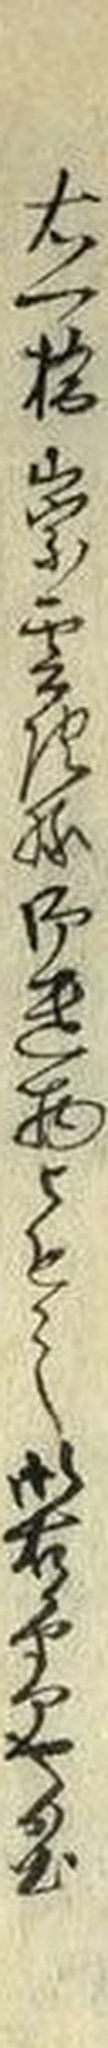右一橋崇雲院様御遺物被進之御右筆部屋ゟ出
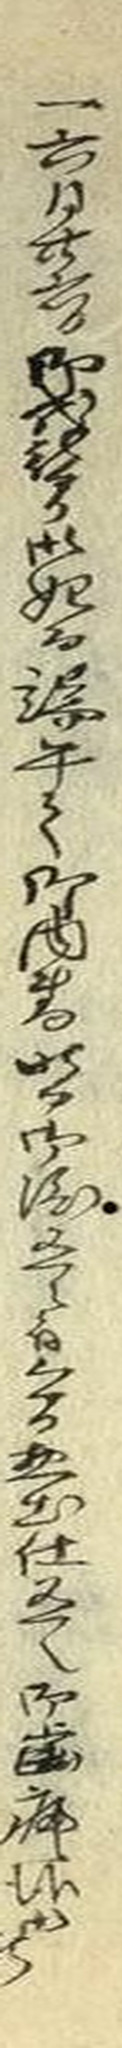一六月廿六日御代替り御始而端午之御内書昨日御渡有之ニ付今日惣出仕有之御歯痛之趣御断
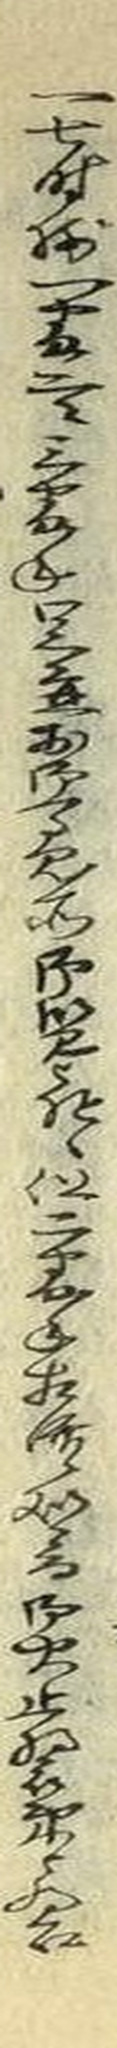一七時揃一番二々三番手足並於御馬見所御覧被遊候但二番手相済候処ニ而御火止装束被為召
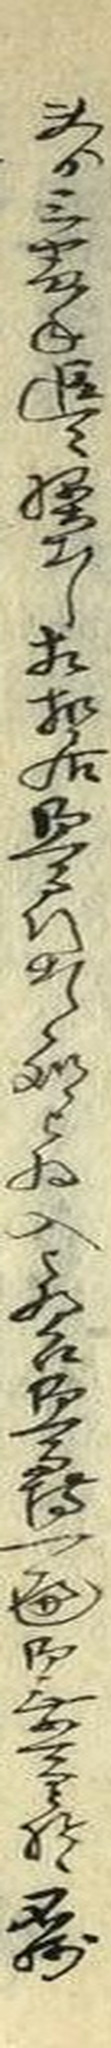夫ゟ三番手追々操出し相控居御馬引出し候処へ被為入被為召御馬場一遍御乗馬被遊候不残
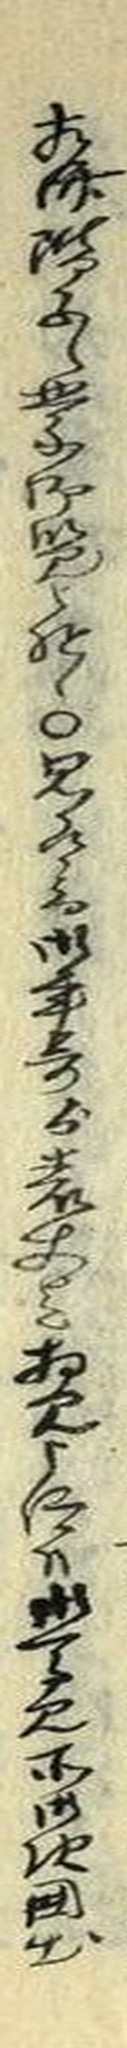相済階子之業御覧被遊候〇思召ニ而御年寄ゟ表使迄拝見被仰付御馬見所御次囲出
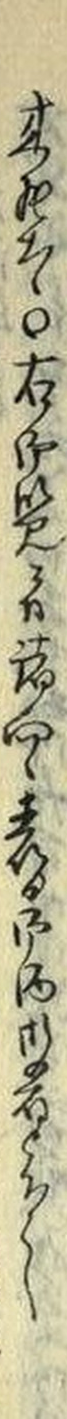来罷出候〇右御覧ニ付諸向へ表ゟ御酒御肴被下之
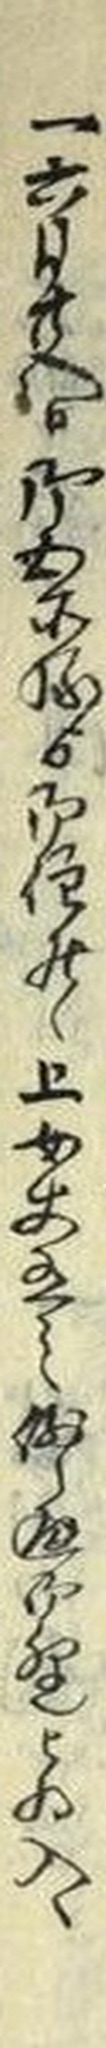一六月廿八日御五所様ゟ御住居へ上女使有之例之通御逢被為入候
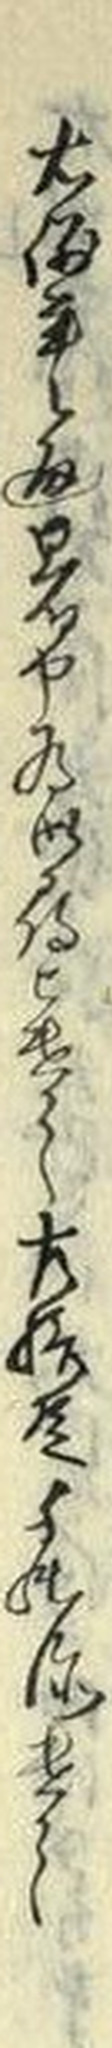右例年之通暑中為御尋被遣之左膳殿手紙添遣之
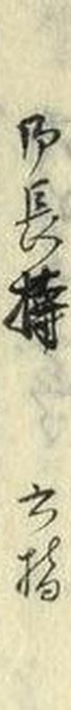御長持六指
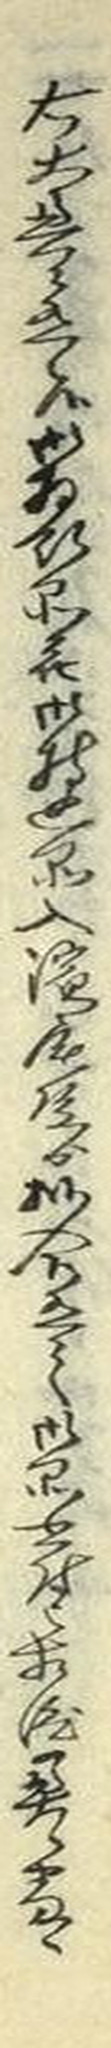右大奥ニ有之候御拝領品幷御持込品入浜尾殿ゟ掛合有之御品書付被相渡奥之番へ
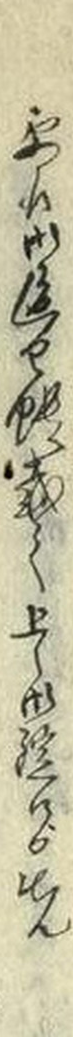受取御道具帳へ載之上之御錠口ゟ出ル
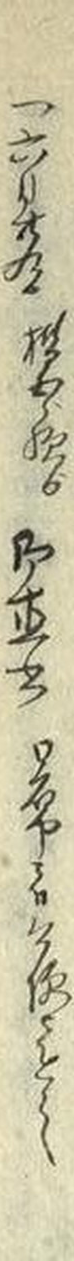一六月廿九日楷五郎様ゟ御直書暑中ニ付今便被進之
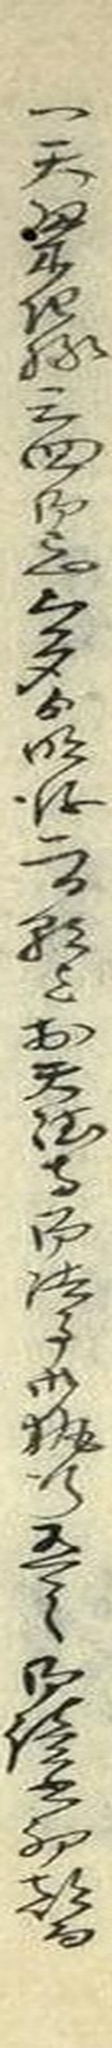一天梁院様三四御忌今夕ゟ明後二日朝迄於天徳寺御法事御執行有之御読書初都而
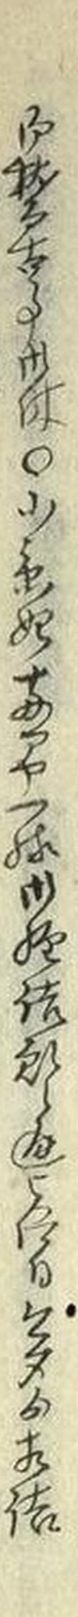御稽古事御休〇小兵衛始両部屋一統御経詰願之通被仰付今夕ゟ相詰
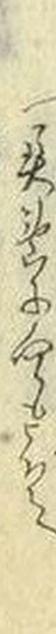奥台子向へも被下之
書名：少傅日録抄（斉善付側向頭取日記、在府）
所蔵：福井県文書館 Fukui Prefectural Archives
